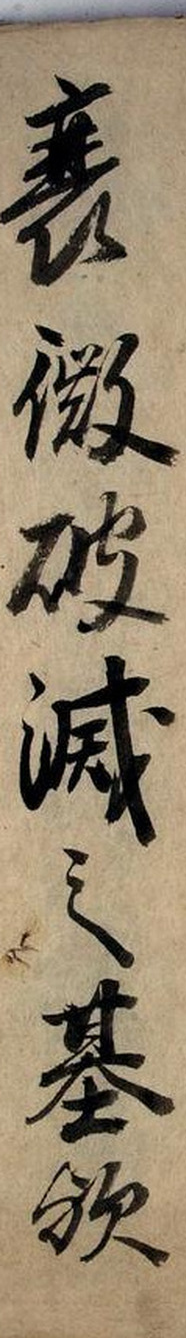表微破滅之基歟
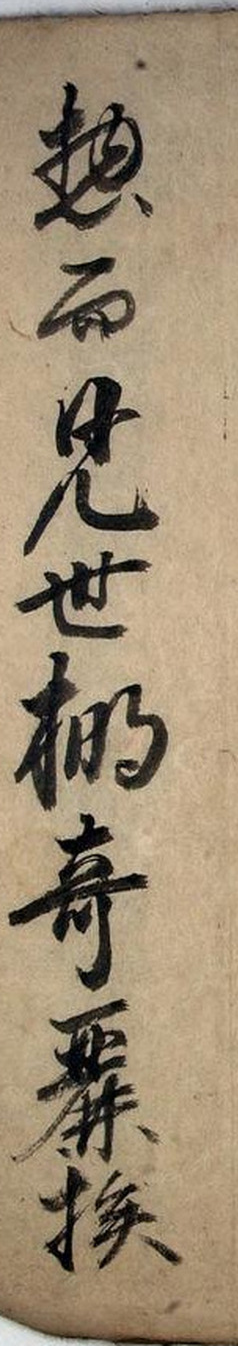惣而見世物奇麗挨

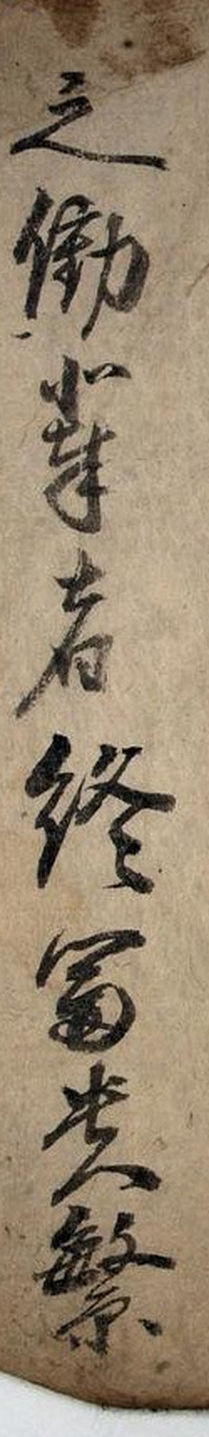之働輩者終冨貴繁
